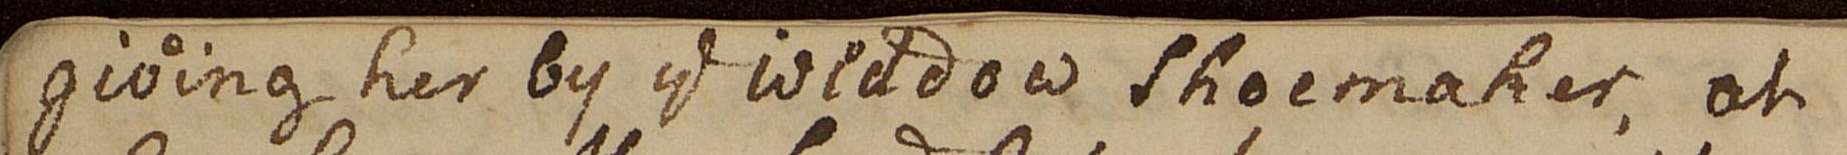giving her by y^e Widdow Shoemaker, at
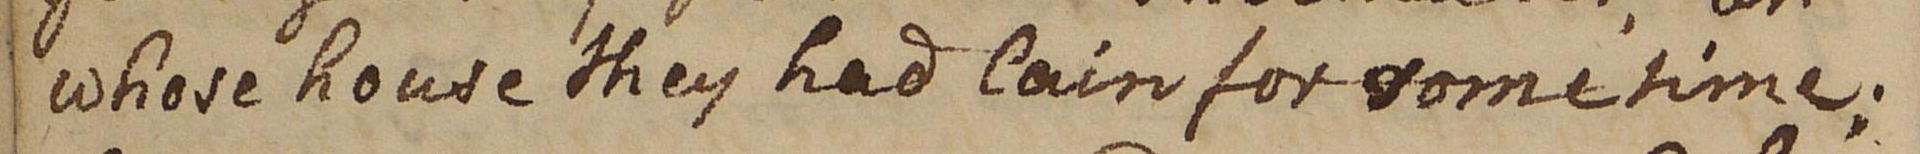whose house they had lain for some time.
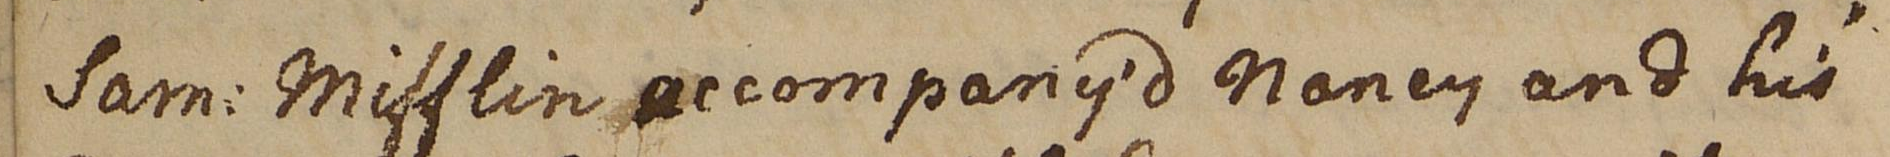Sam: Mifflin accompany'd Nancy and his
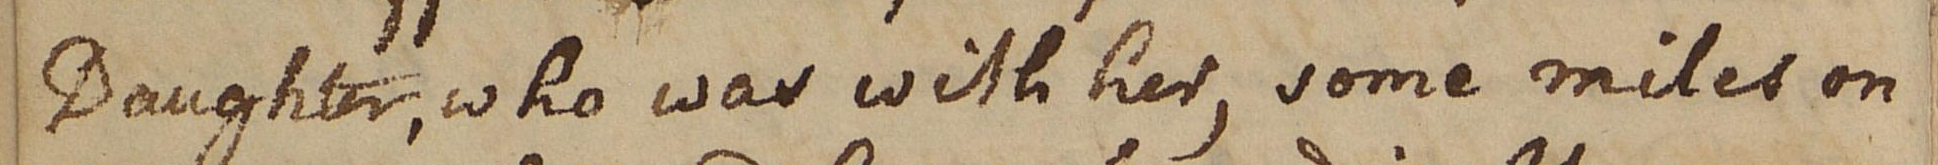Daughter who was with her, some miles on
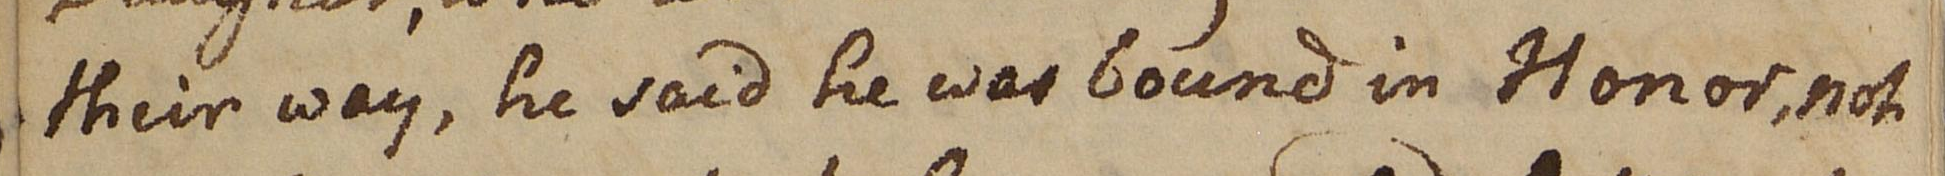their way, he said he was bound in Honor, not
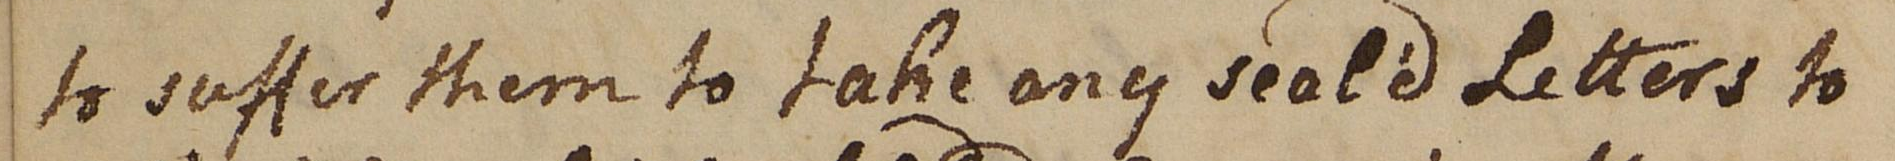to suffer them to take any seal'd Letters to
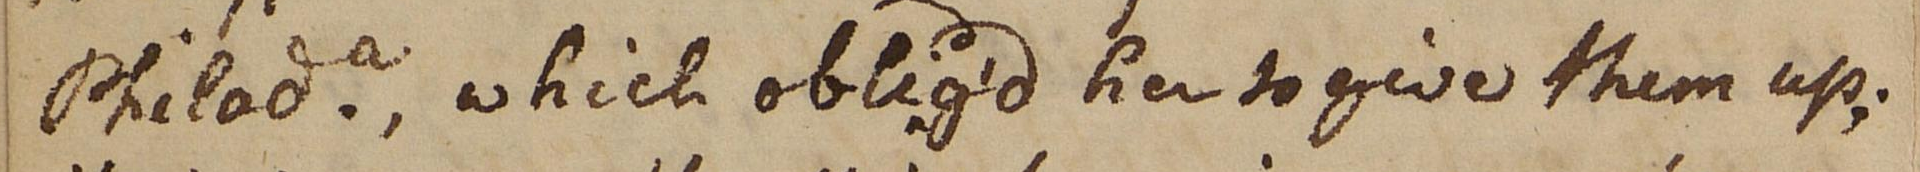Philad^a. which obli^d g'd her to give them up;
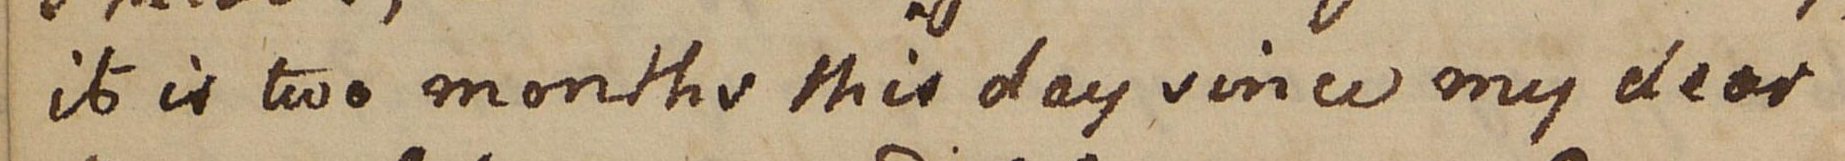it is two months this day since my dear
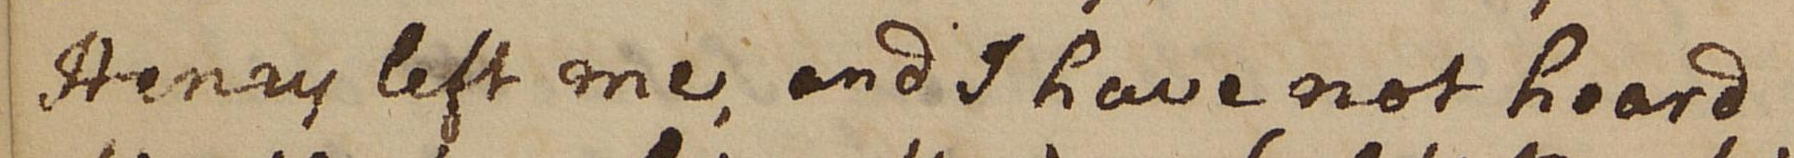Henry left me, and I have not heard
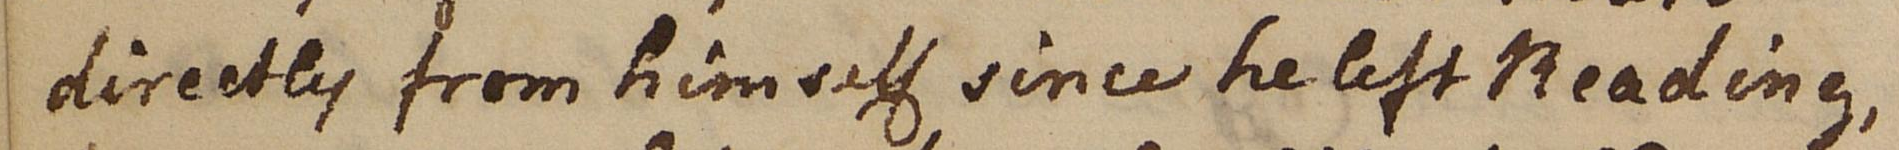directly from himself since he left Reading,
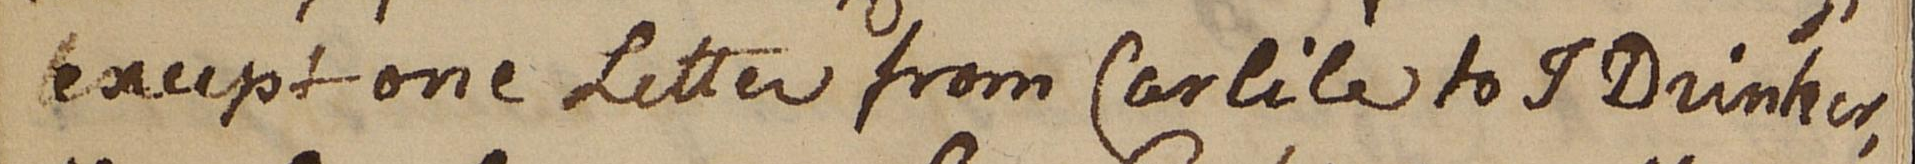except one Letter from Carlile to J Drinker,
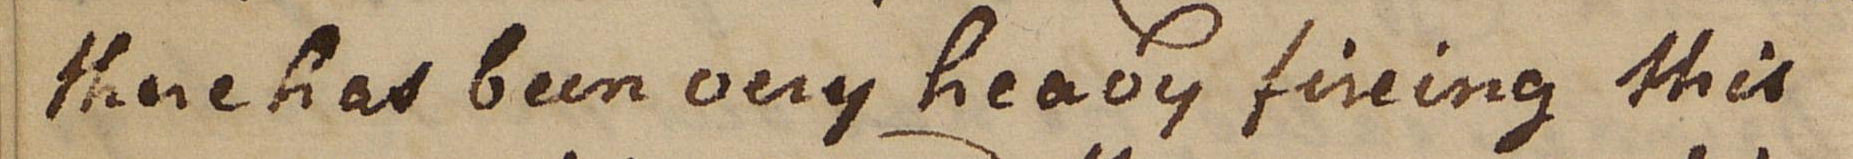there has been very heavy fireing this
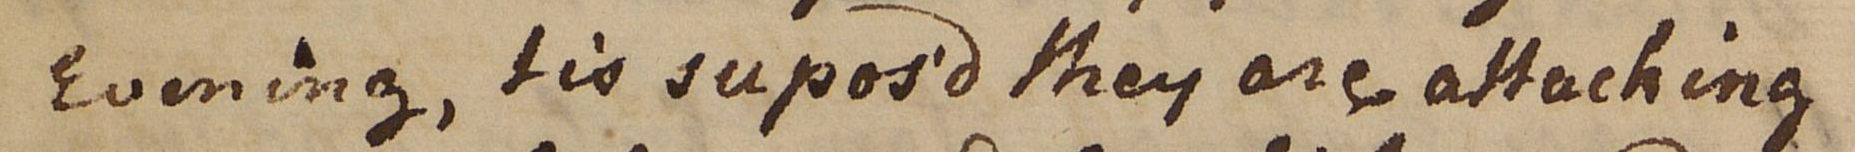Evening, tis supos'd they are attacking
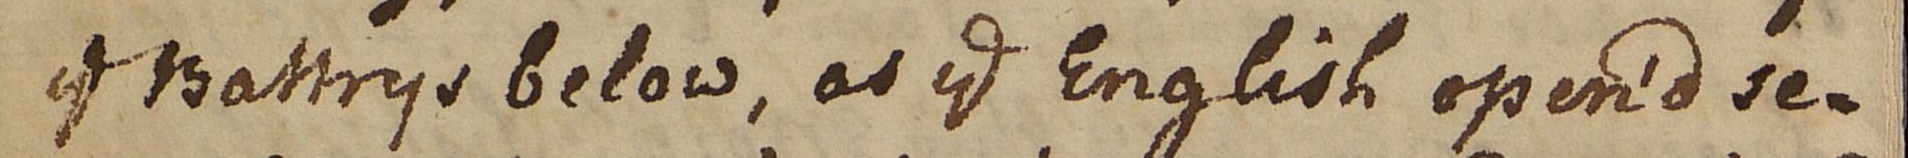y^e Battrys below, as y^e English open'd se-
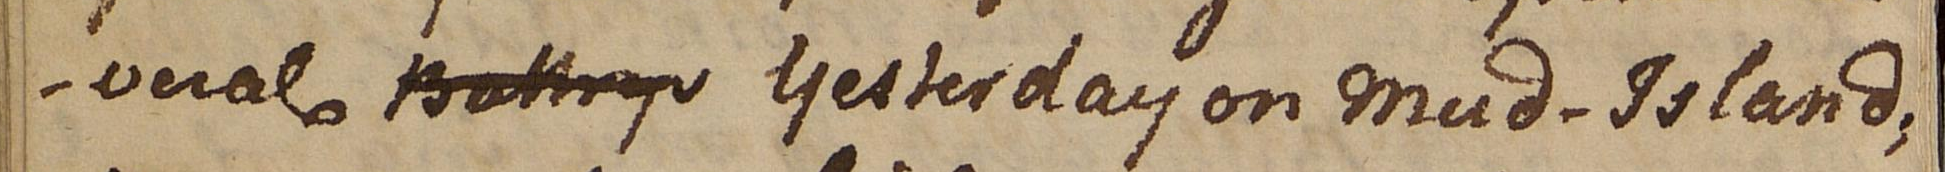-veral [Battrys] Yesterday on Mud- Island;
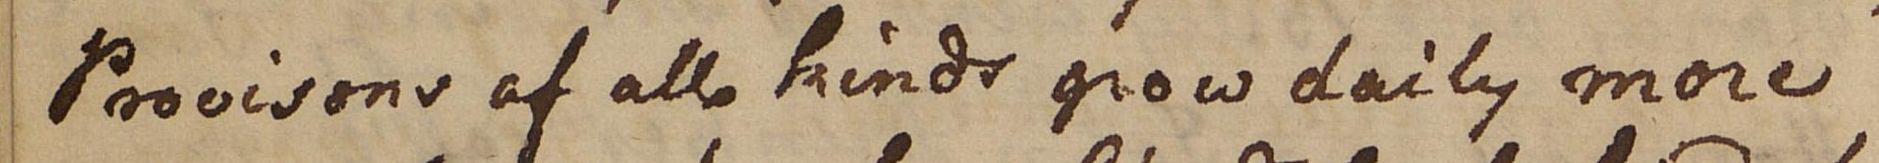Provisons of all kinds grow daily more
